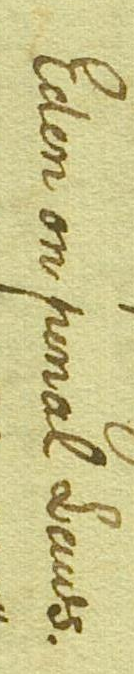Eden on penal Laws.
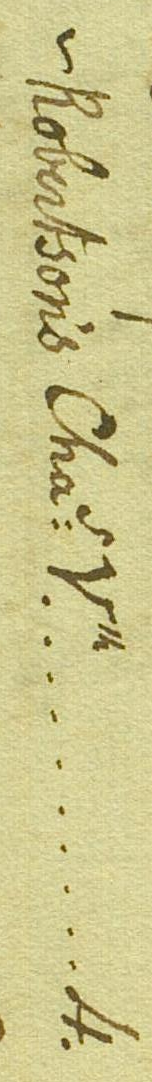- Robertson's Cha^s: V^th....4.
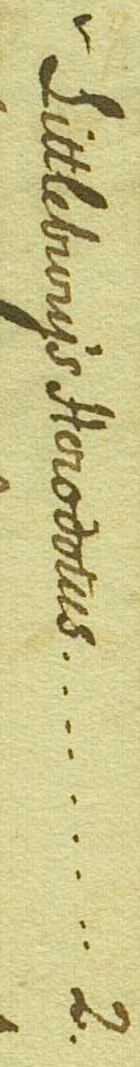- Littlebury's Herodotus. ........ 2.
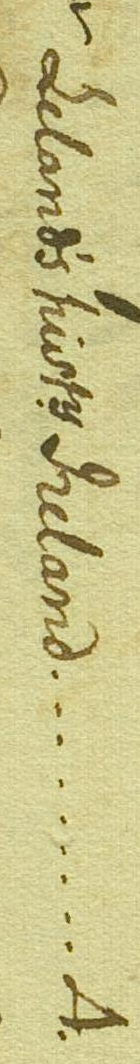- Leland's hist^y Ireland.......... 4.
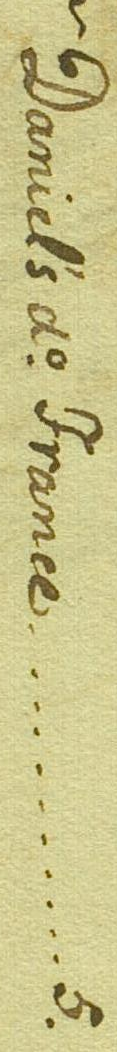- Daniel's d^o. France. ........5.
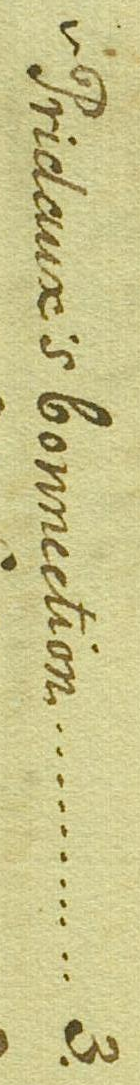- Pridaux's Connection........... 3.
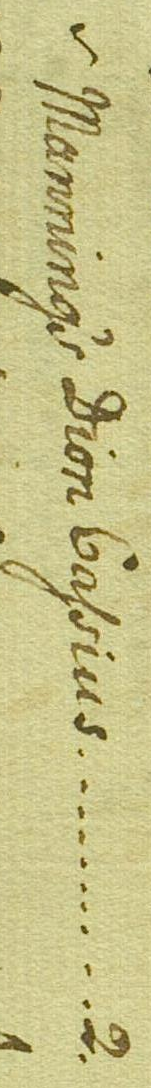- Manning's Dion Cassius.......... 2.
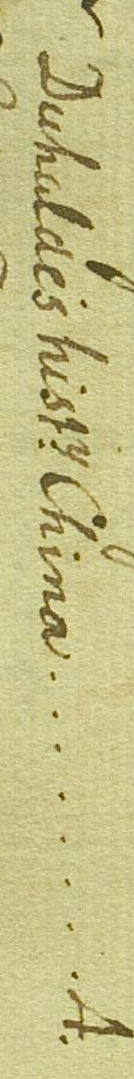- Duhaldes hist^y. China........ 4.
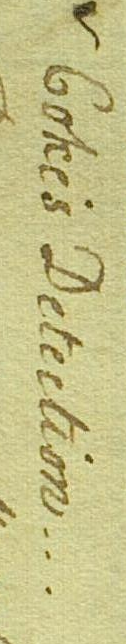- Coke's Detection...
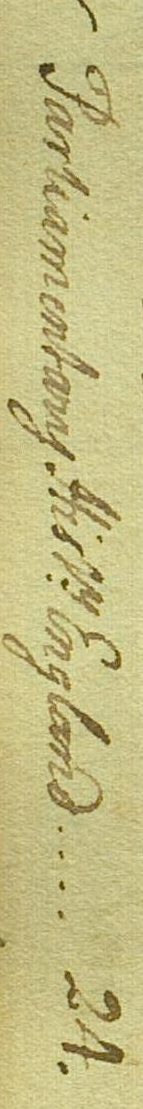- Parliamentary Hist^y. England.... 24.
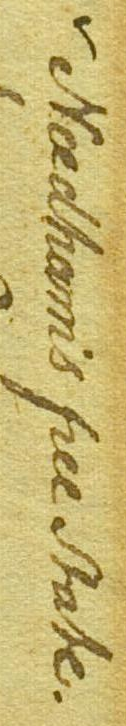- Needham's free State.
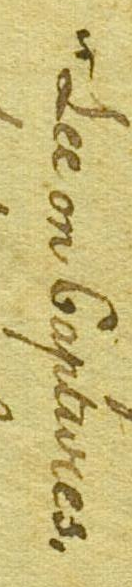- Lee on Captures.
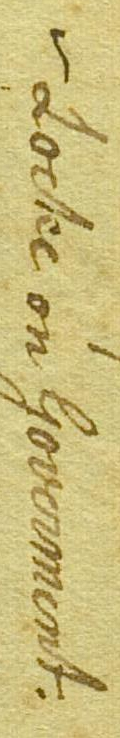- Locke on Goverment.
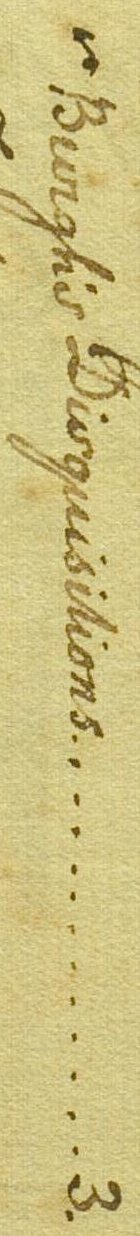- Burgh's Disquisitions.............. 3.
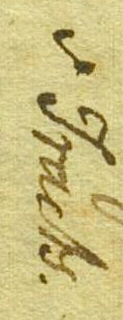- Tracts.
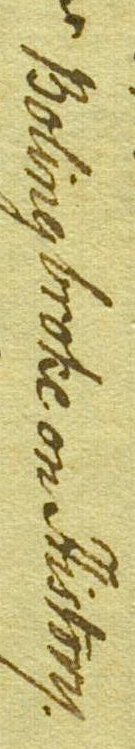- Bolingbroke on History.
